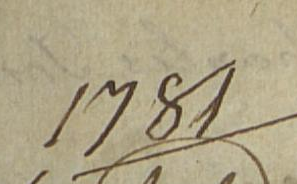1781
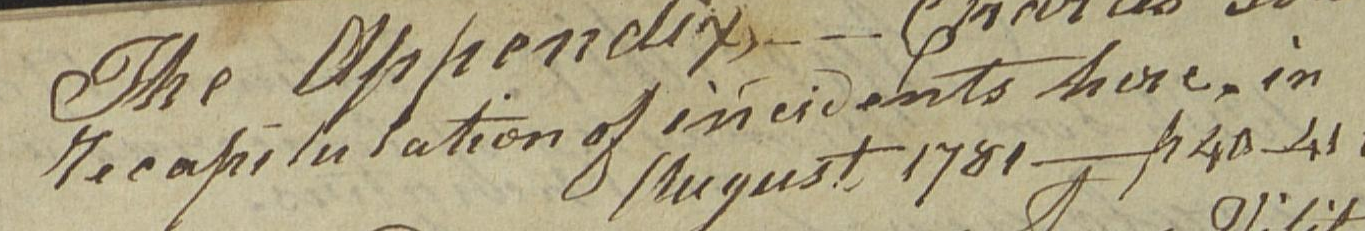Recapitulation of incidents here, in
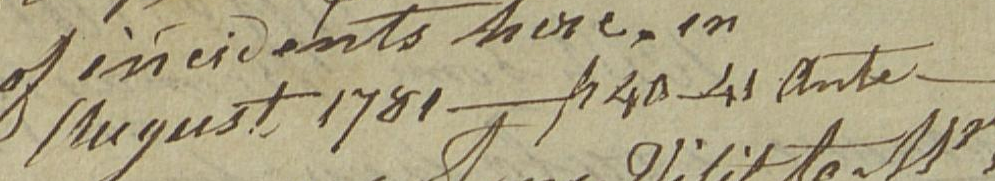August 1781 p40-41 Ante
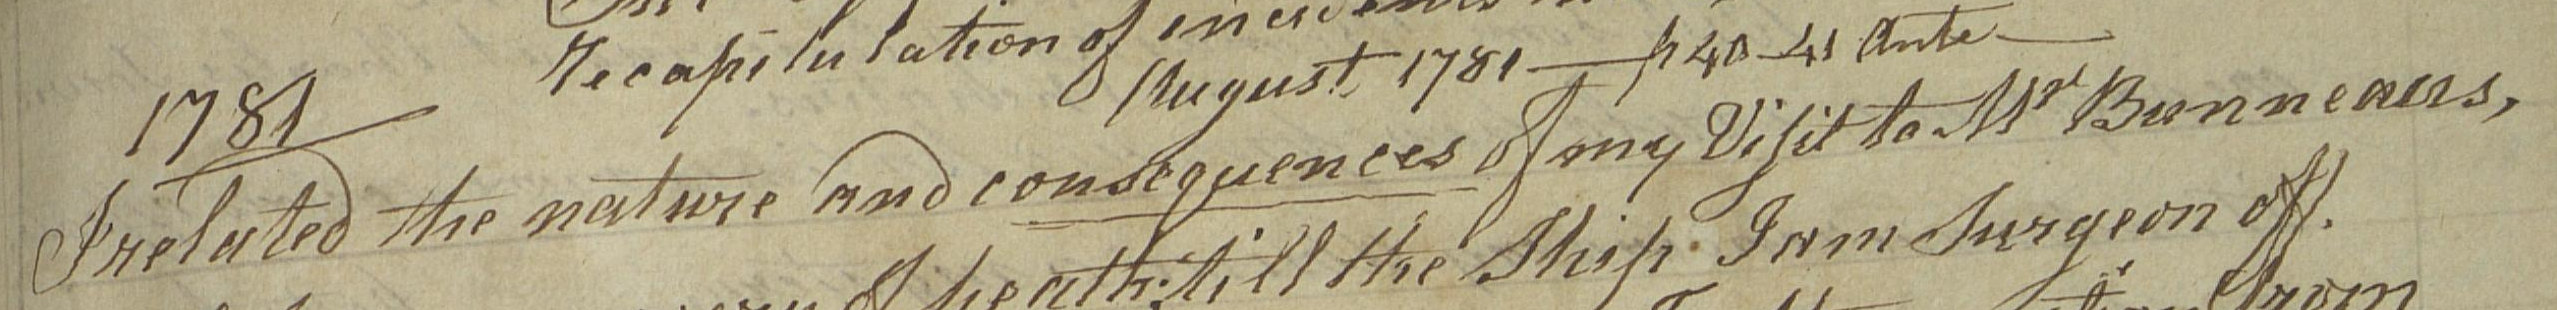I related the nature and consequences of my Visit to M^r Bunneaus,
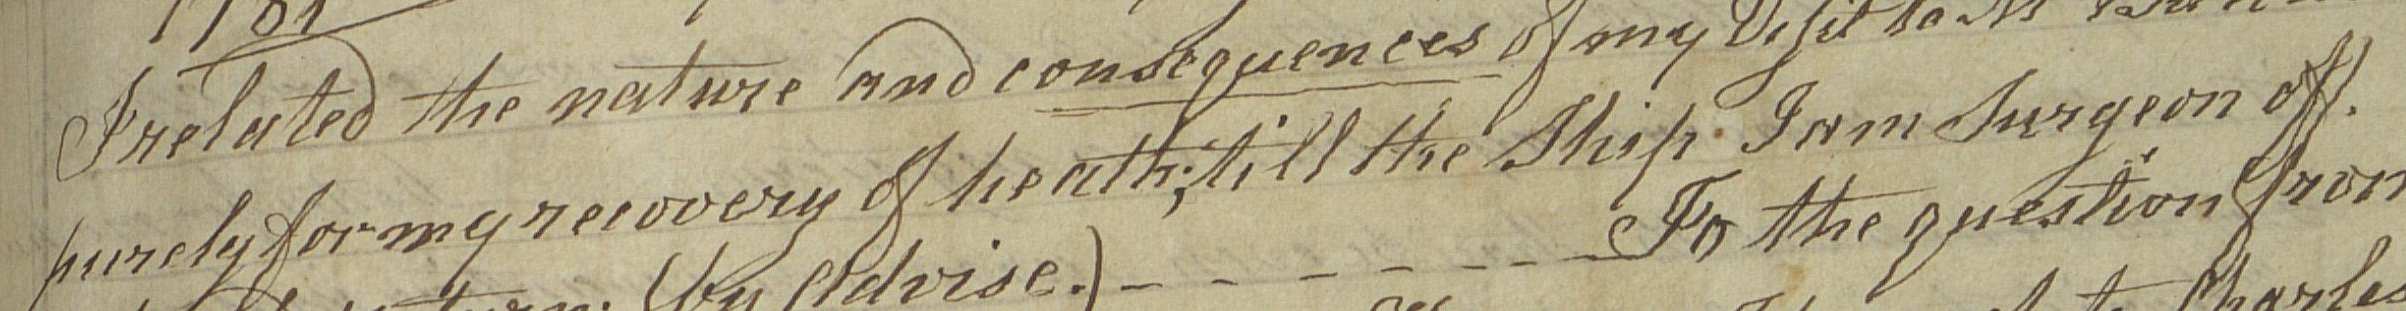purely for my recovery of heath; till the Ship I am Surgeon off.
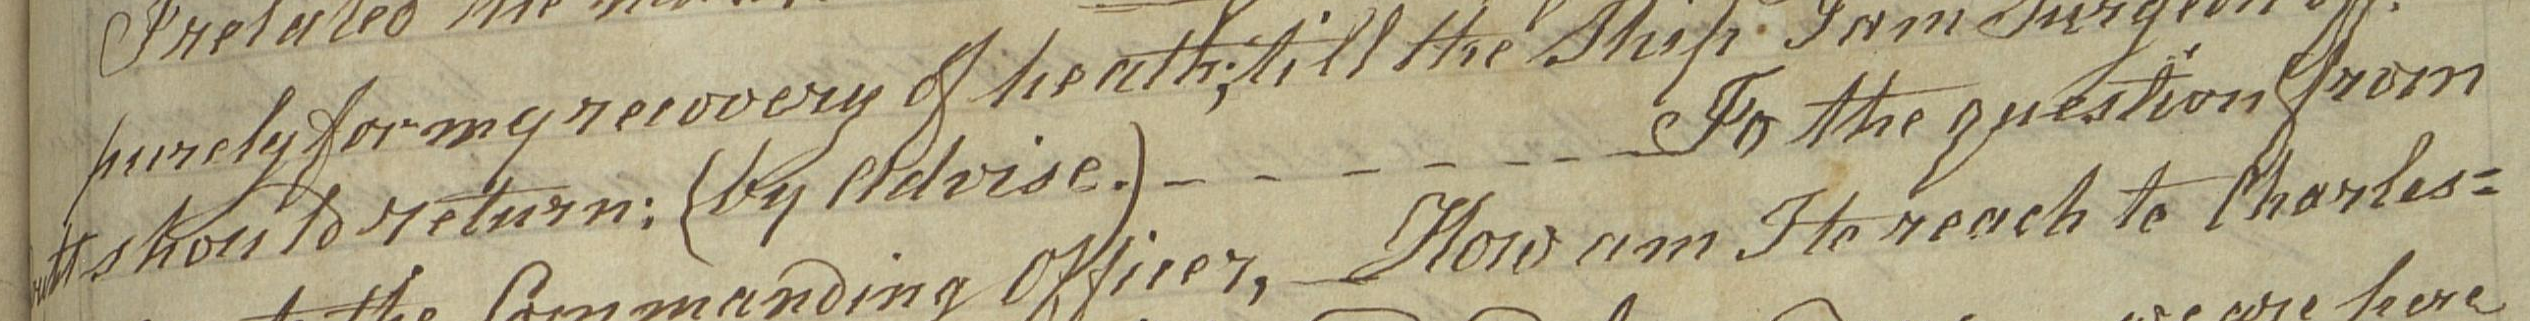-tt should return (by advise.) In the question from
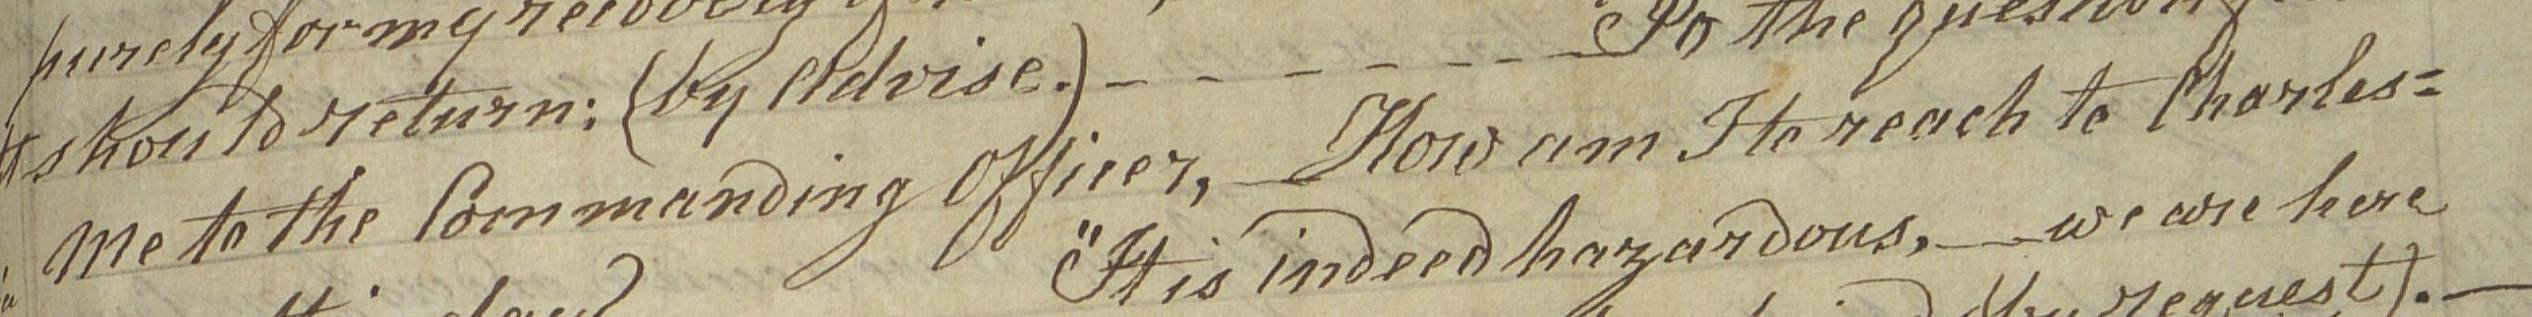me to the Commanding Officer, How am I to reach to Charles-
